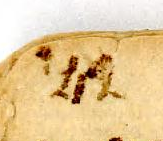42
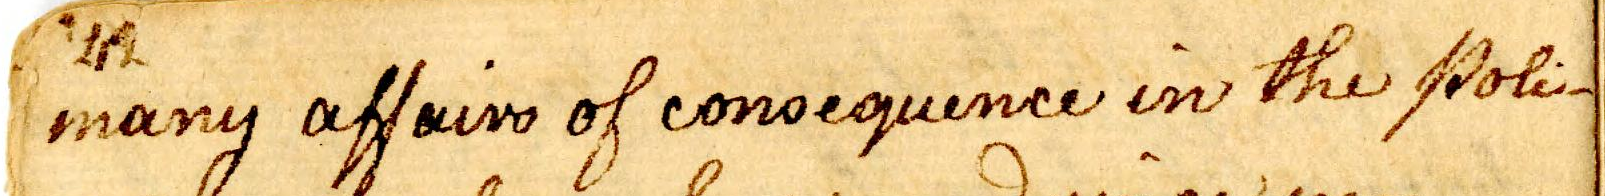many affairs of consequence in the Poli-
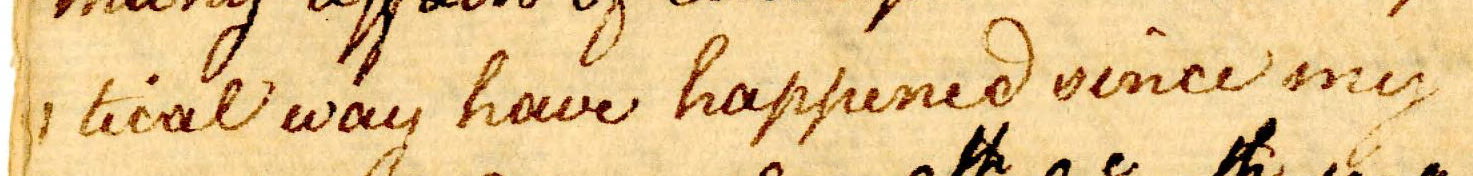-tical way have happened since my
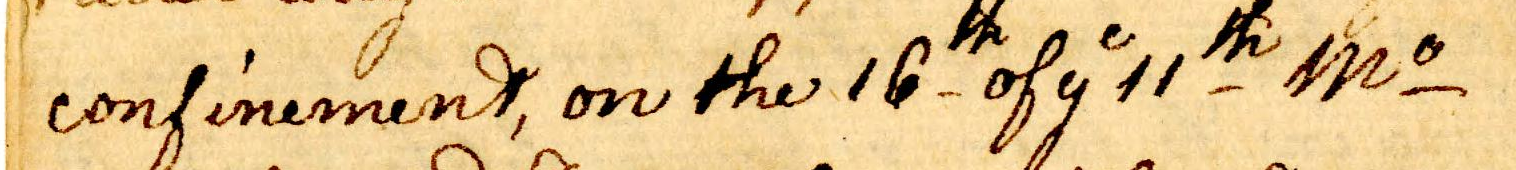confinement, on the 16^th of y^e 11^th M^o
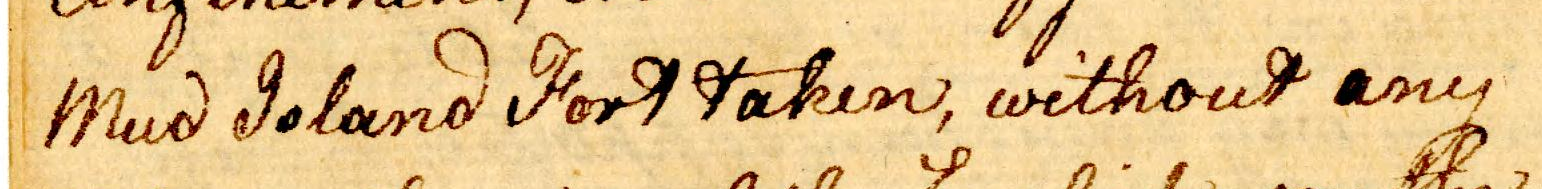Mud Island Fort taken, without any
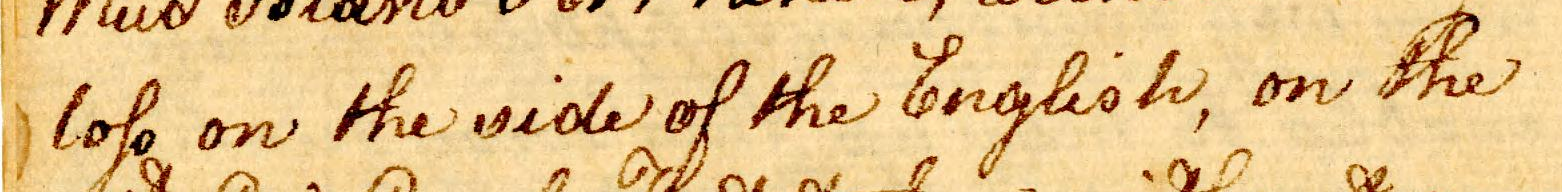loss on the side of the English, on the
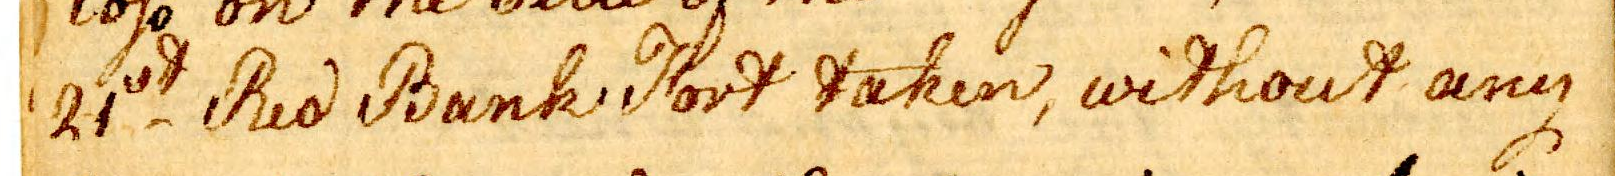21^st Red Bank Fort taken, without any
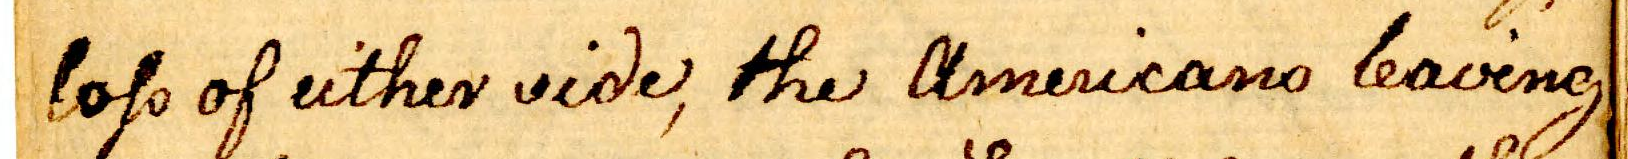loss of either side, the Americans leaving
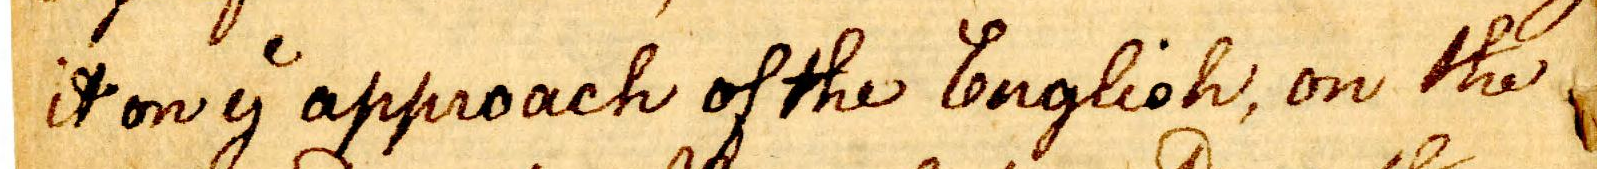it on y^e approach of the English on the
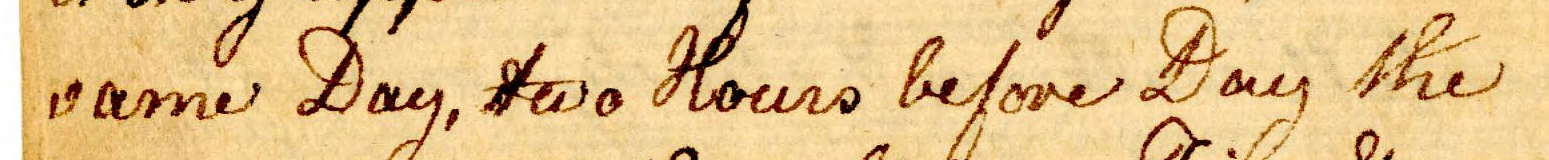same Day, two Hours before Day the
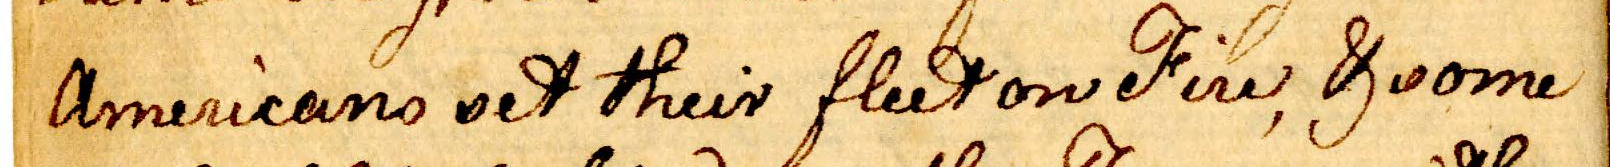Americans set their fleet on Fire & some
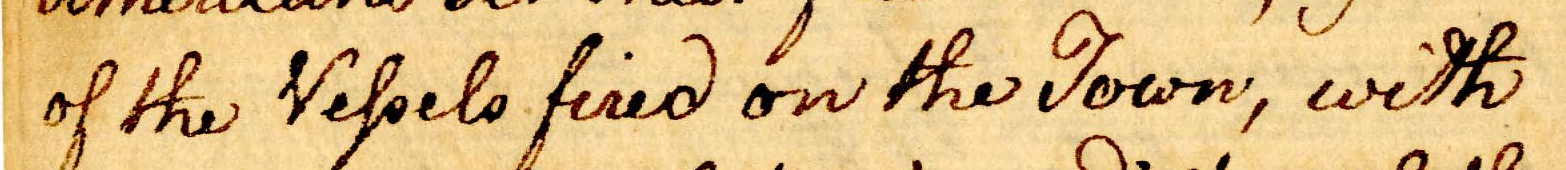of the Vessels fired on the Town, with
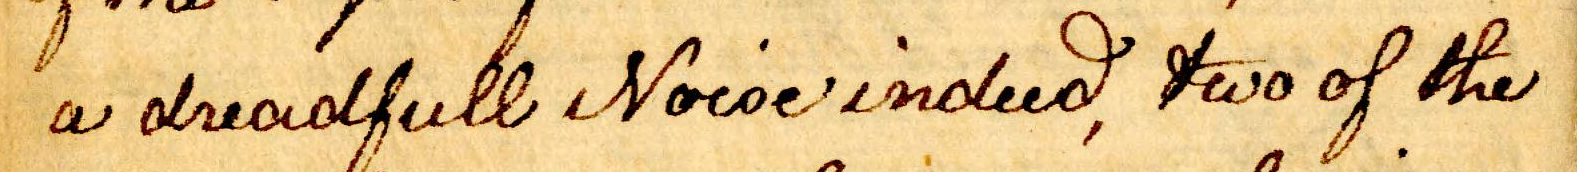a dreadfull Noise indeed, two of the
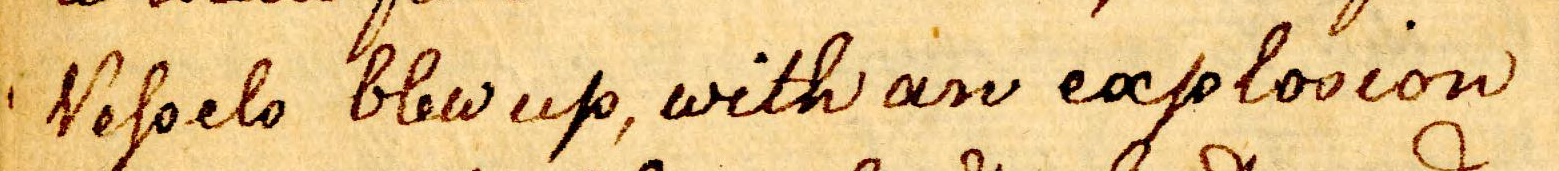Vessels blew up, with an explosion
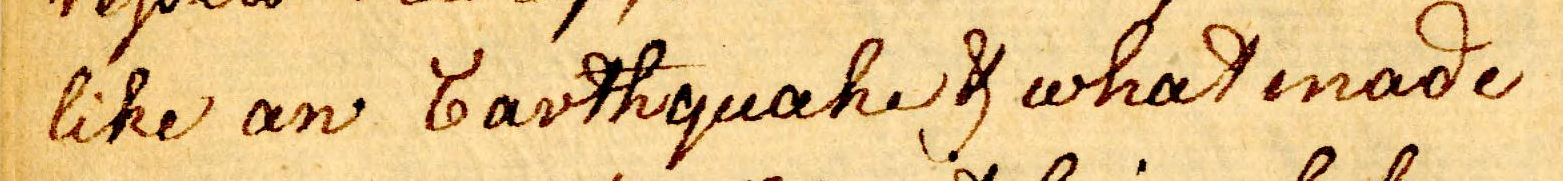like an Earthquake & what made
